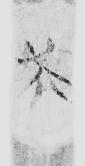{廿六}
